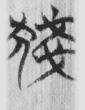{犬戔}
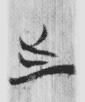之
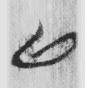㠯（以）
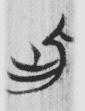此
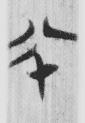{八千}
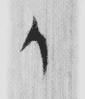人
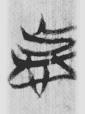者
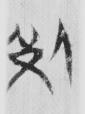死
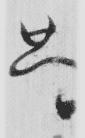也
